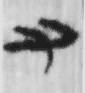又
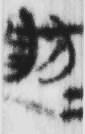病病
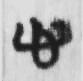心
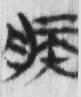疾
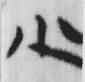少
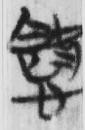○（氣）
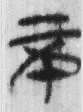不
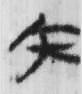內（入）
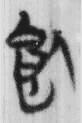○（食）
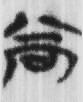尚
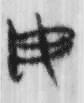母
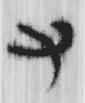又（有）
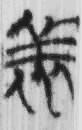羕（殃）
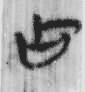占
